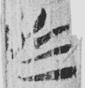於
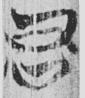君
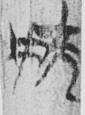○（幸）
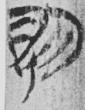則
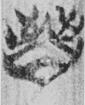晉
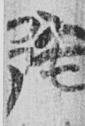○（邦）
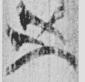之
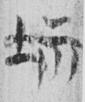社
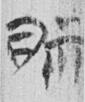○（稷）
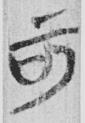可
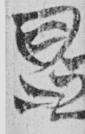○（得）
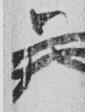而
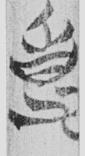事
